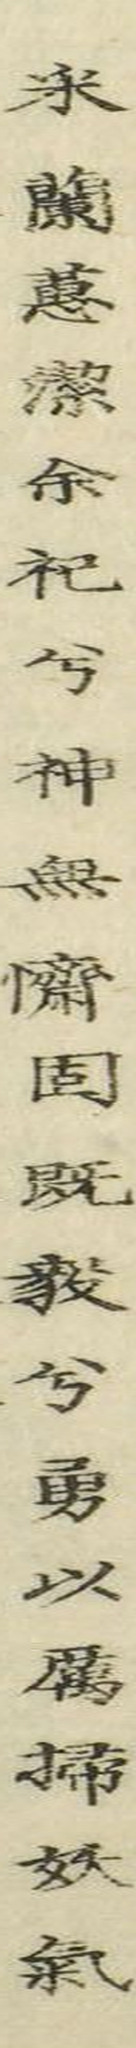采蘭蕙潔余祀兮神無𢥖固既毅兮勇以厲掃妖氣
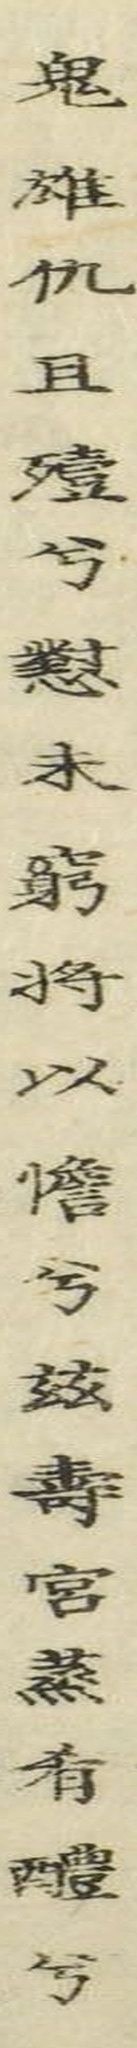鬼雄仇且殪兮懟未窮將以憺兮玆壽宮蒸肴醴兮
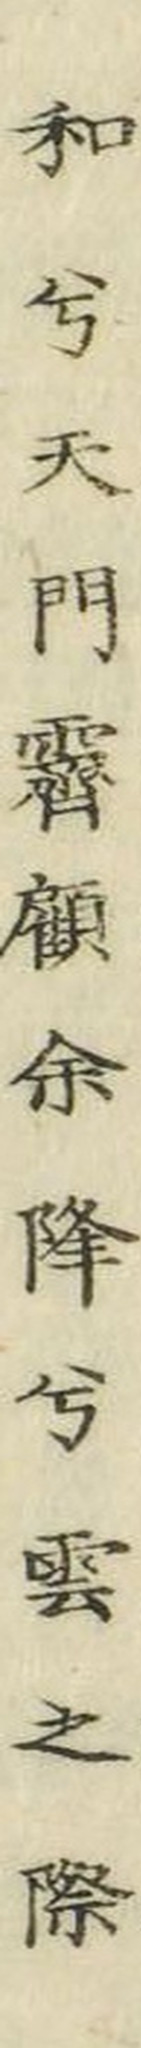和兮天門霽顧余降兮雲之際
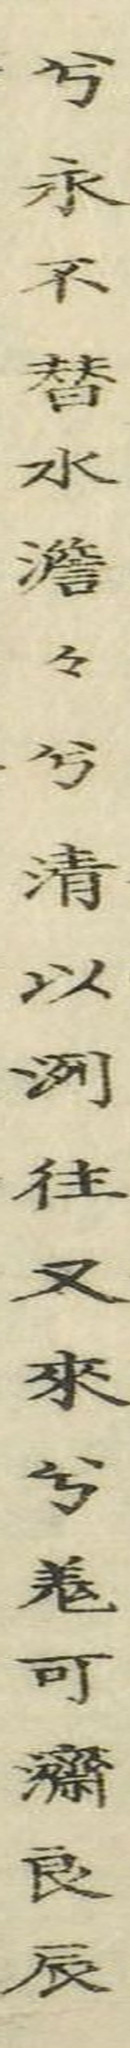兮永不替水澹々兮清以冽往又來兮羗可𢥖良辰
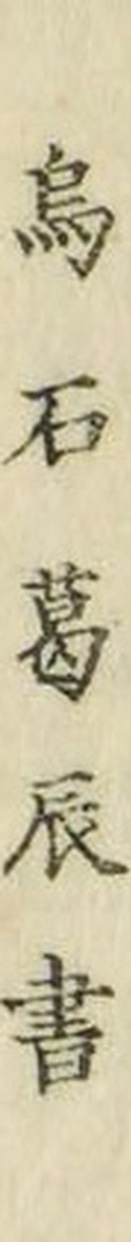烏石葛辰書
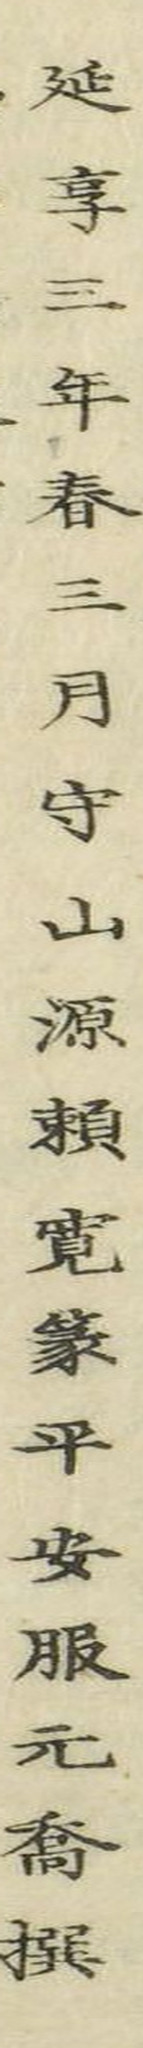延享三年春三月守山源頼寛篆平安服元喬撰
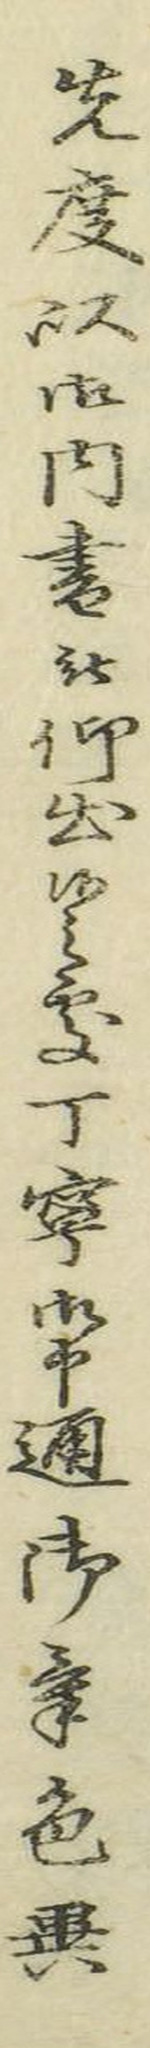先度以御内書被仰出候之處丁寧御申通御氣色異
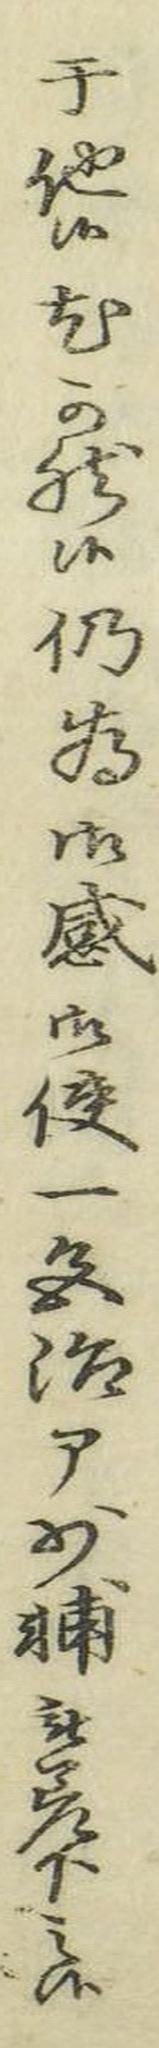于他候尤可然候仍為御感御使一色治部少輔被差下之候
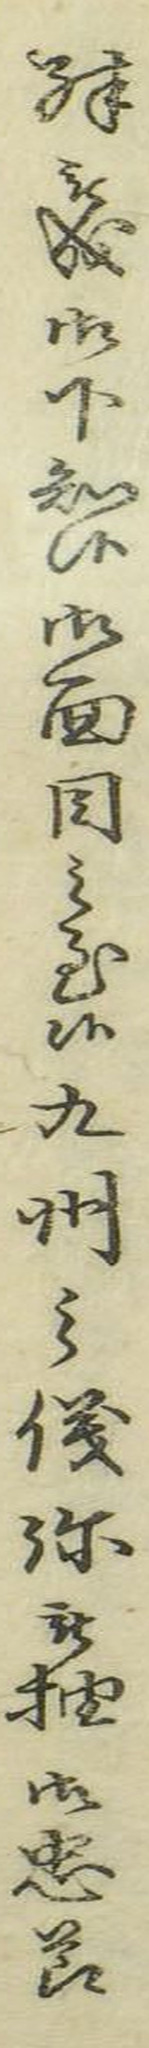殊被成御下知候御面目之至候九州之儀弥被抽御忠節

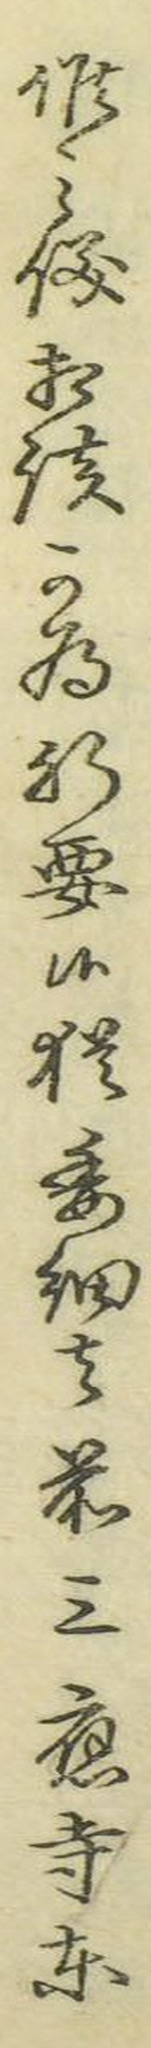候之儀相談可為肝要候猶委細者前三應寺東
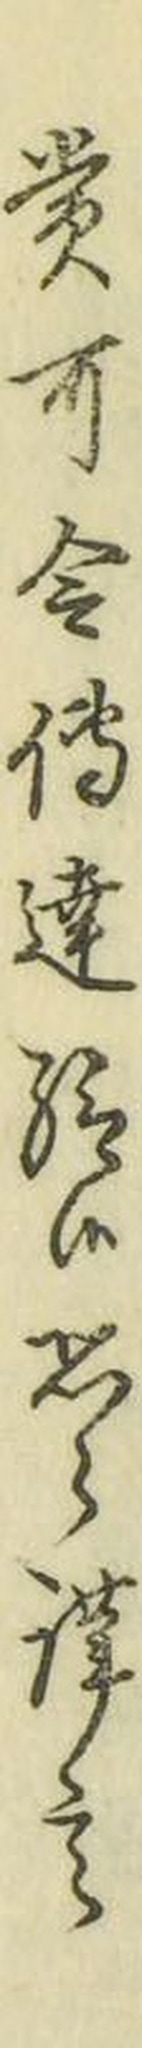賞可令傳達給候恐々謹言
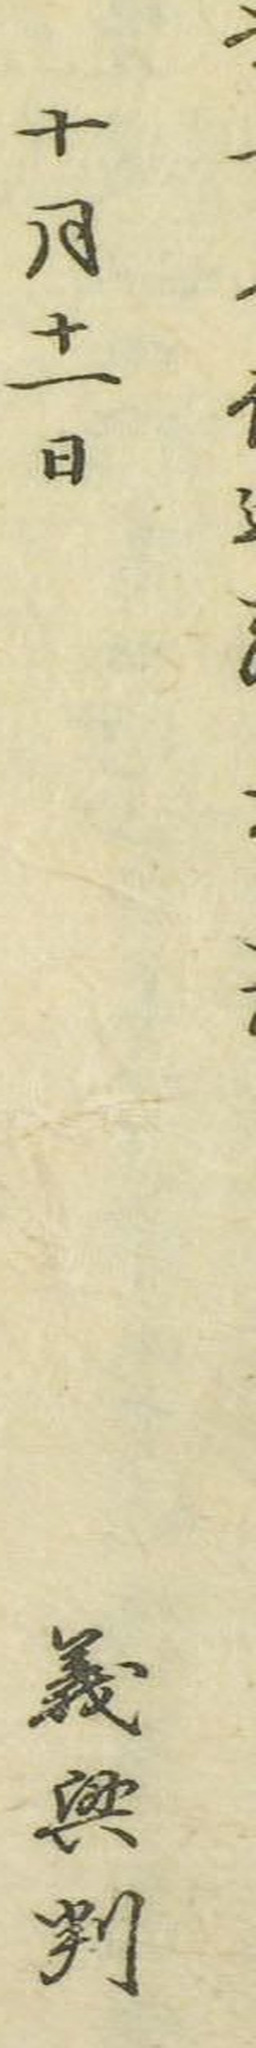十月十一日義興判
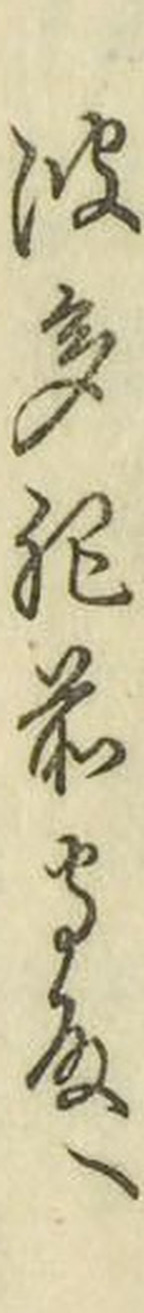波多肥前守殿へ
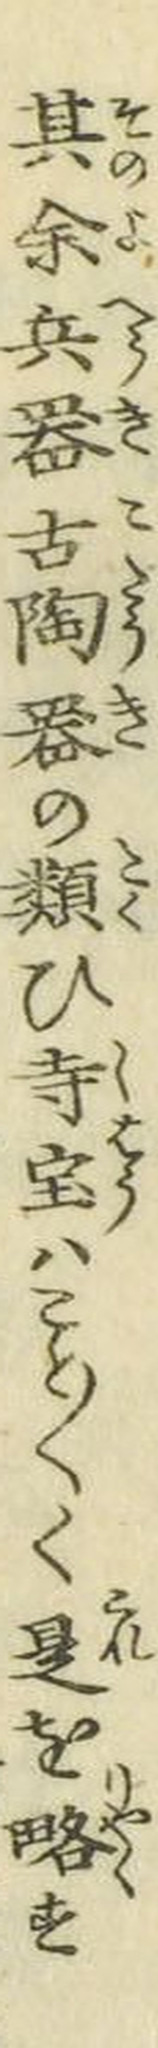其余兵器古陶器の類ひ寺宝はこと〳〵く是を略す
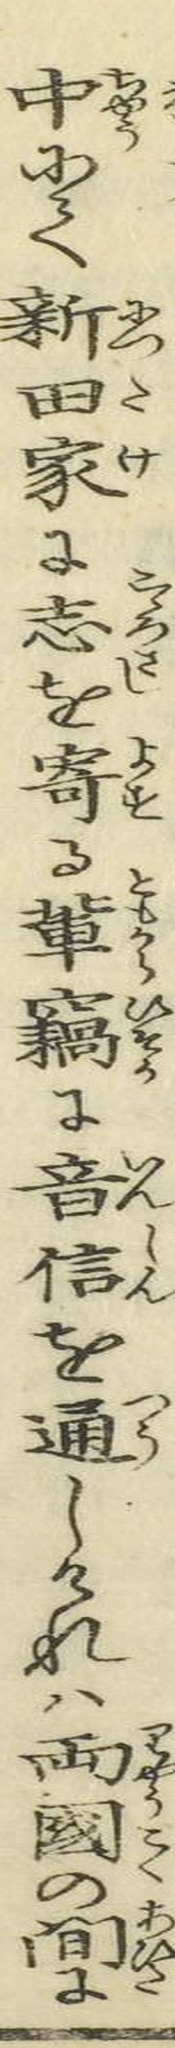中にて新田家に志を寄る軰竊に音信を通しけれは両國の間に
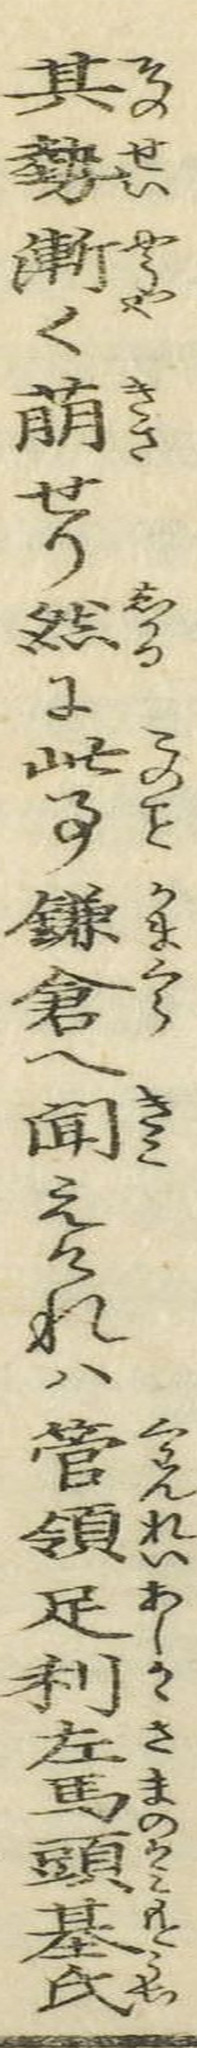其勢漸く萌せり然に此事鎌倉へ聞えけれは管領足利左馬頭基氏
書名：江戸名所図会 20巻 巻之4
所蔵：東京学芸大学教育コンテンツアーカイブ
